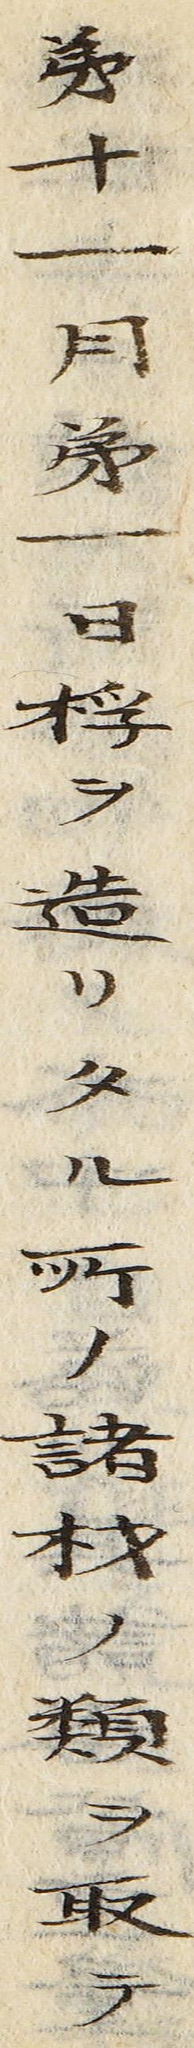第十一月第一日桴ヲ造リタル所ノ諸材ノ類ヲ取テ
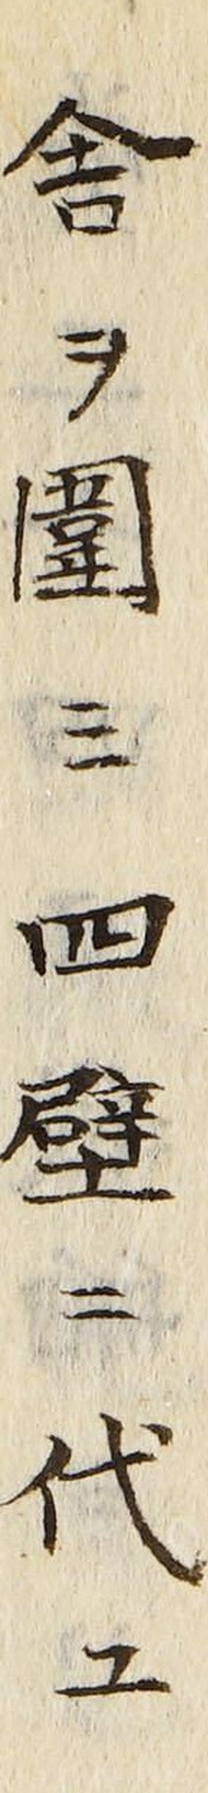舎ヲ囲ミ四壁ニ代ユ
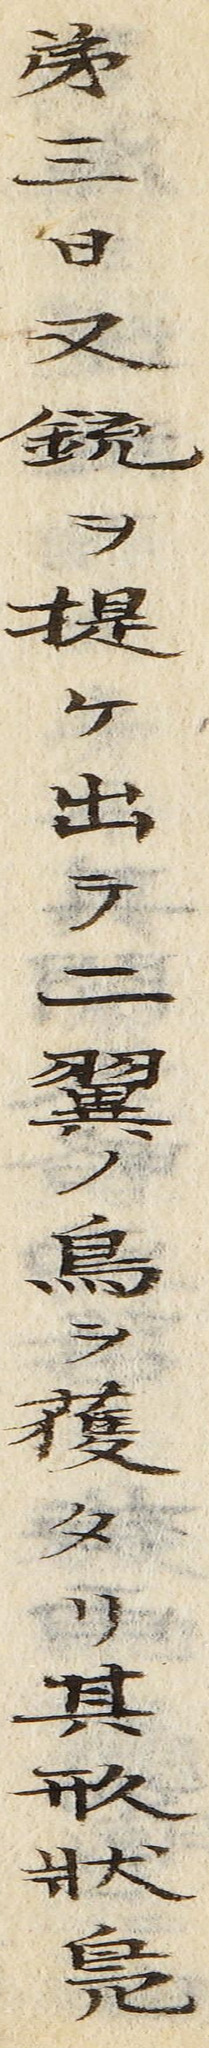第三日又銃ヲ提ケ出テ二翼ノ鳥ヲ獲タリ其形状鳧
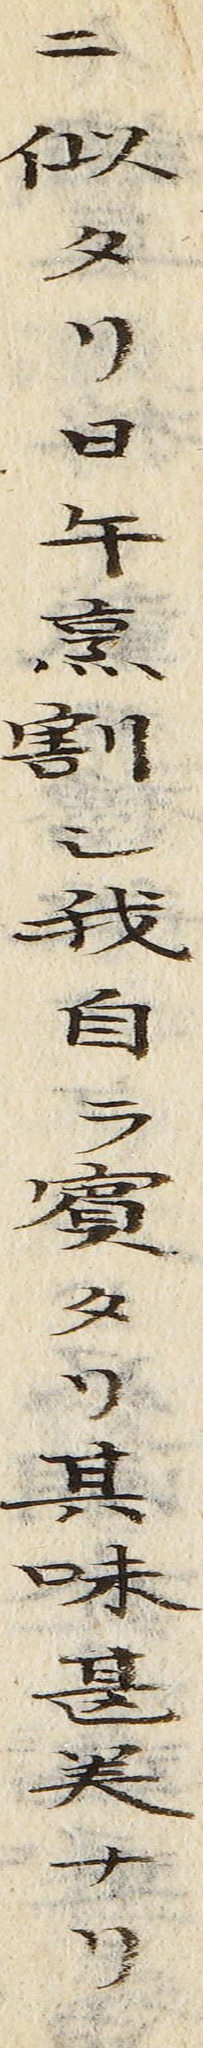ニ似タリ日午烹割シ我自ラ賓タリ其味甚美ナリ
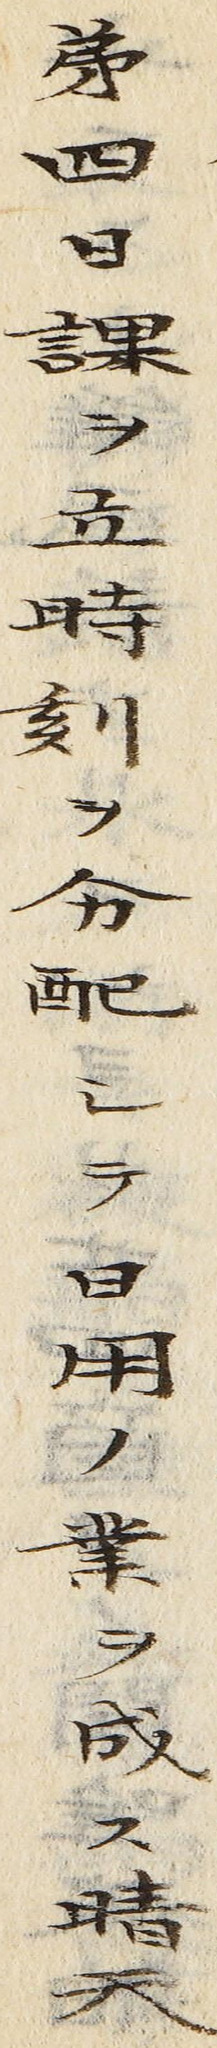第四日課ヲ立時刻ヲ分配シテ日用ノ業ヲ成ス晴天
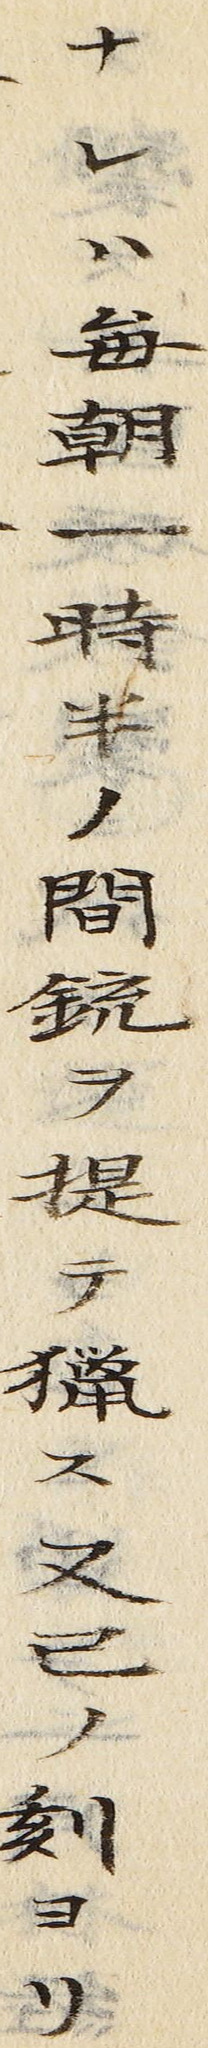ナレハ毎朝一時半ノ間銃ヲ提テ猟ス又巳ノ刻ヨリ
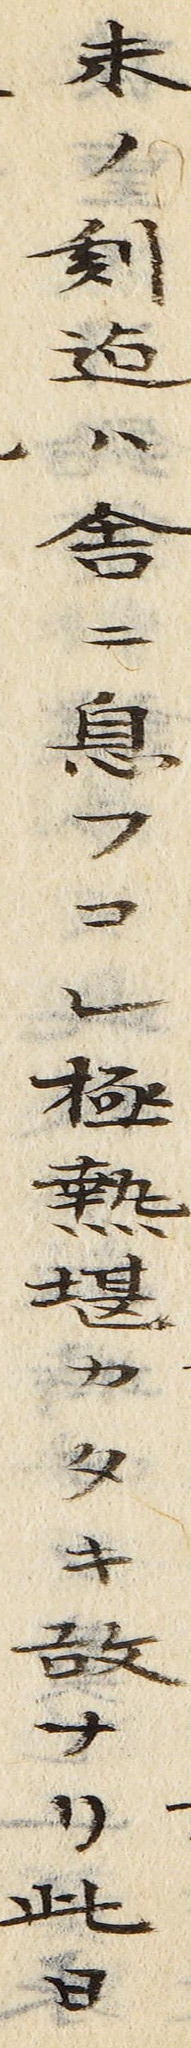未ノ刻迄ハ舎ニ息フコレ極熱堪カタキ故ナリ此日
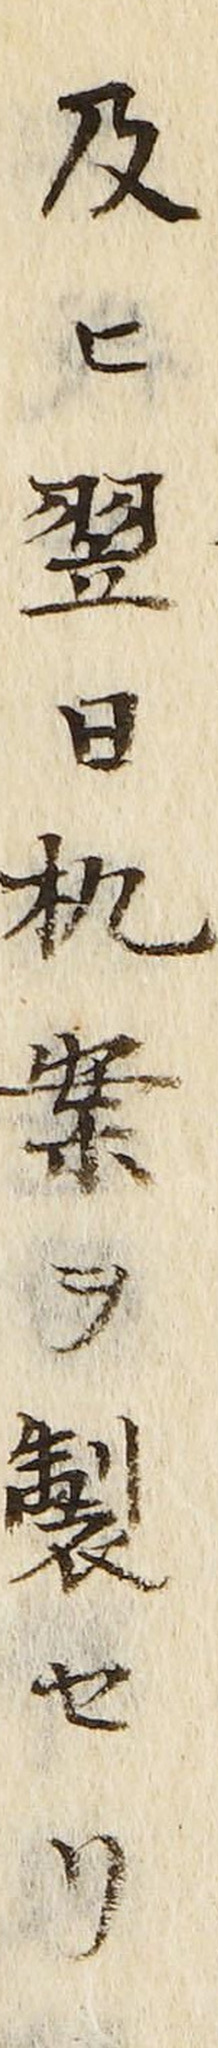及ヒ翌日机案ヲ製セリ
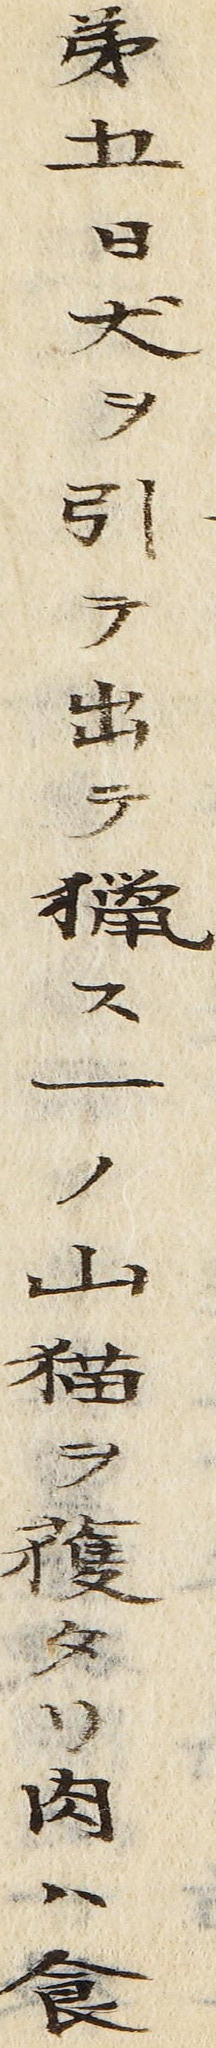第五日犬ヲ引テ出テ猟ス一ノ山猫ヲ獲タリ肉ハ食
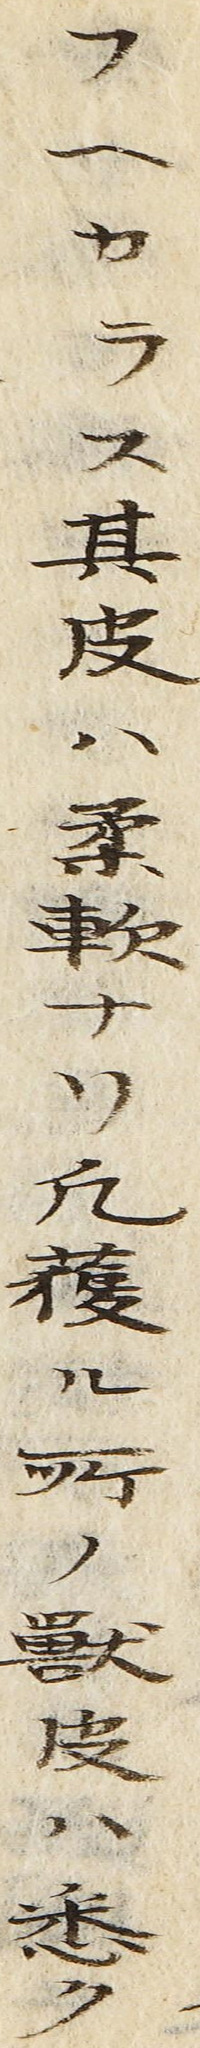フヘカラス其皮ハ柔軟ナリ凡獲ル所ノ獣皮ハ悉ク
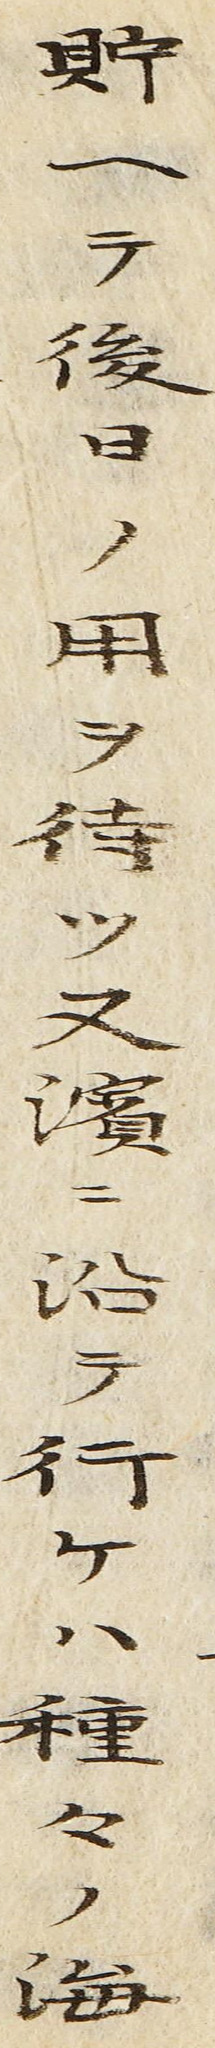貯ヘテ後日ノ用ヲ待ツ又浜ニ沿テ行ケハ種々ノ海
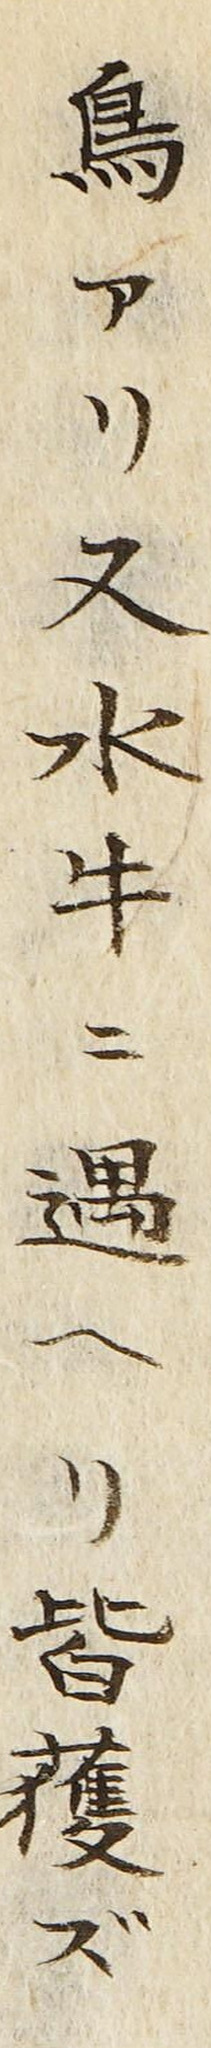鳥アリ又水牛ニ遇ヘリ皆獲ズ
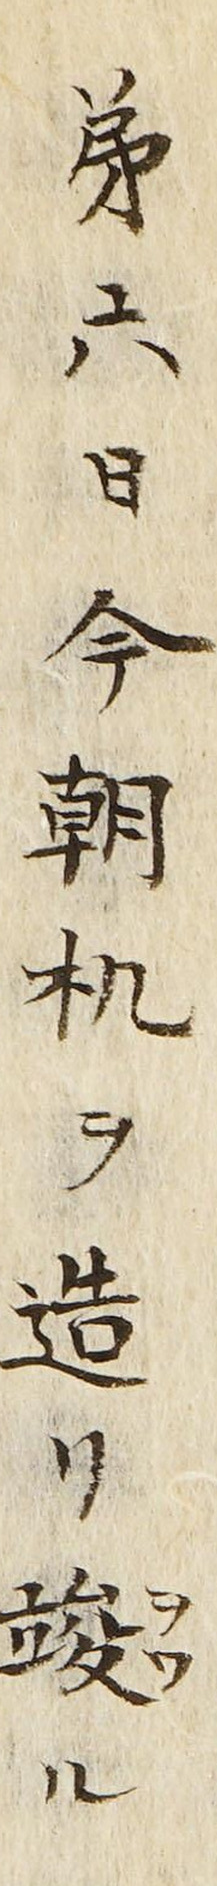第六日今朝机ヲ造リ竣ル
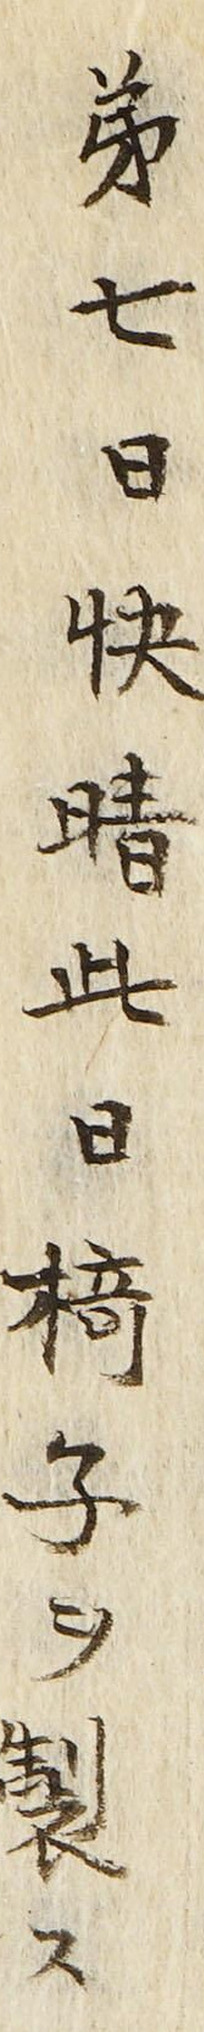第七日快晴此日椅子ヲ製ス
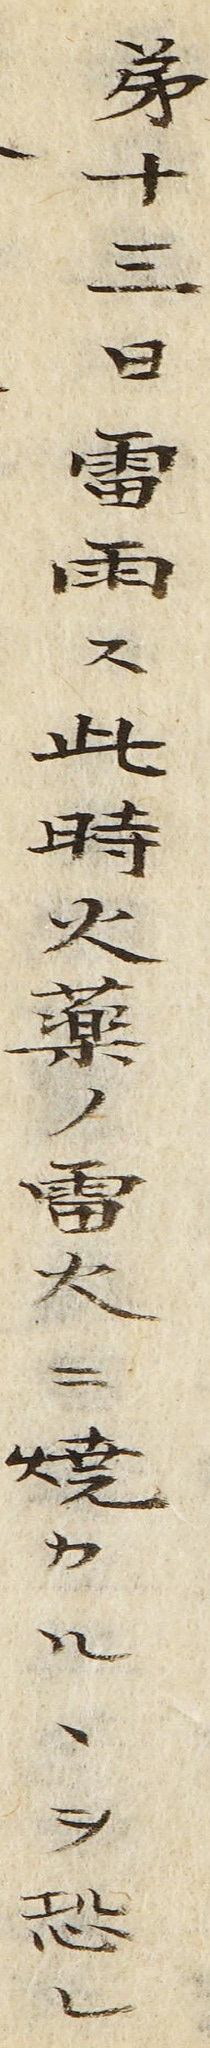第十三日雷雨ス此時火薬ノ雷火ニ焼カルヽヲ恐レ
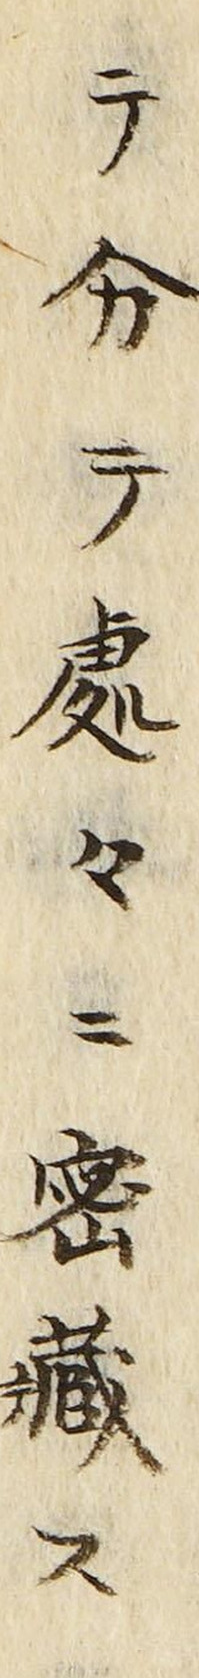テ分テ処々ニ密蔵ス
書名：漂流紀事
